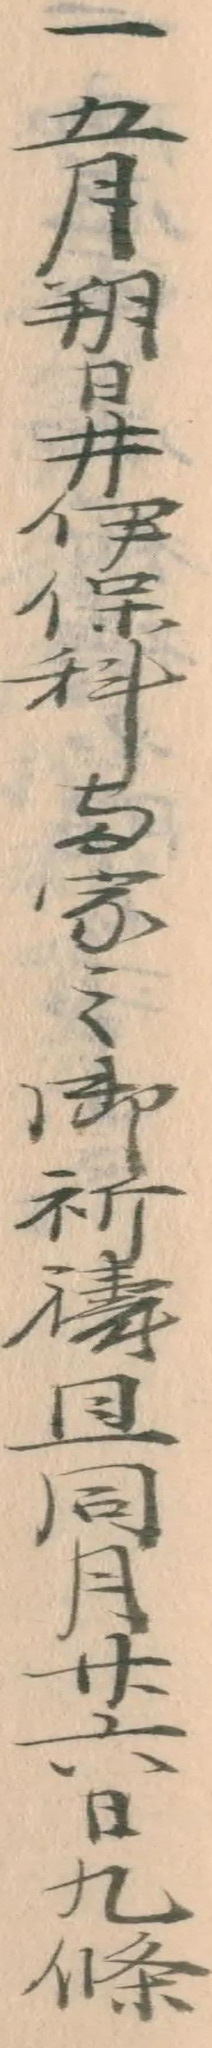一五月朔日井伊保科両家之御祈祷且同月廿六日九條
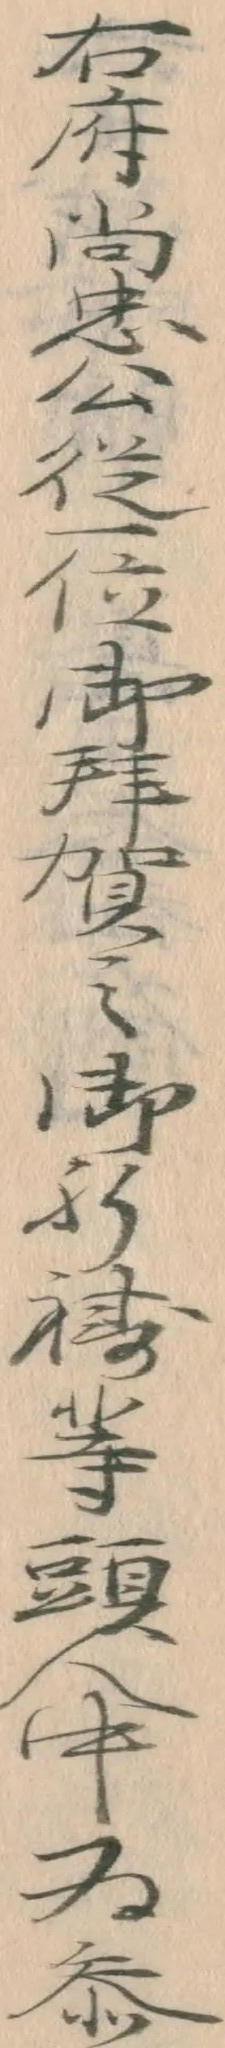右府尚忠公従一位御拝賀之御祈祷等頭人中為参
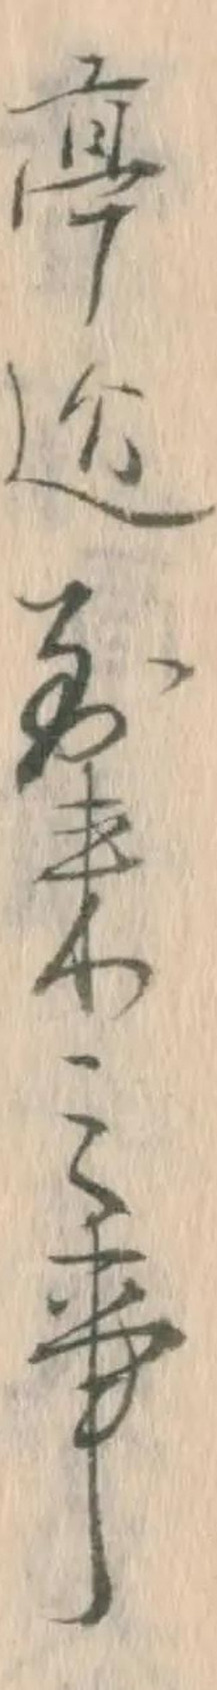亭迄到来之事
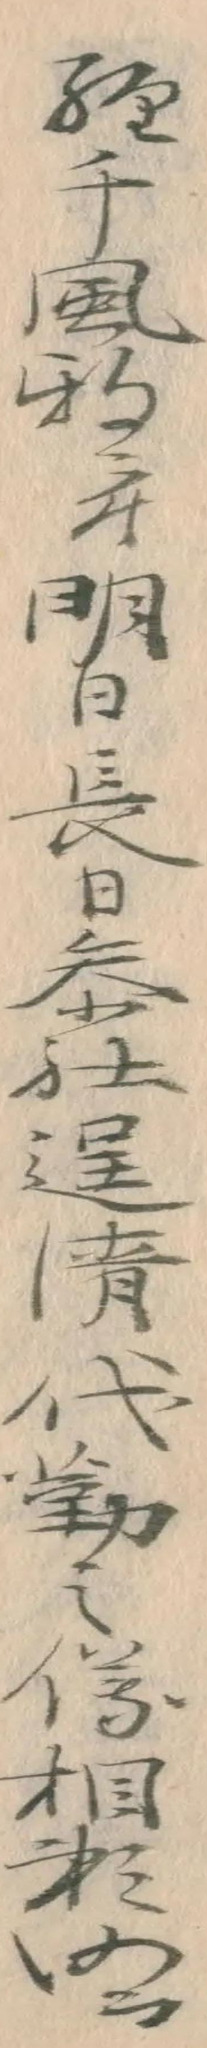一経千風邪ニ付明日長日参社逞清代勤之儀相頼仍而
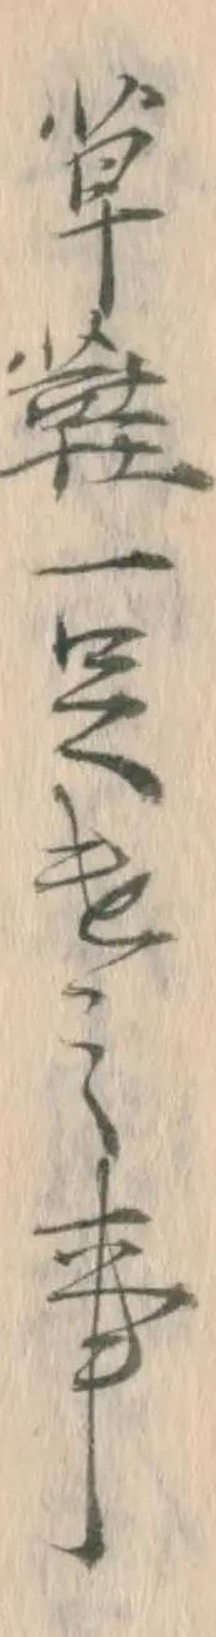草鞋一足遣之事
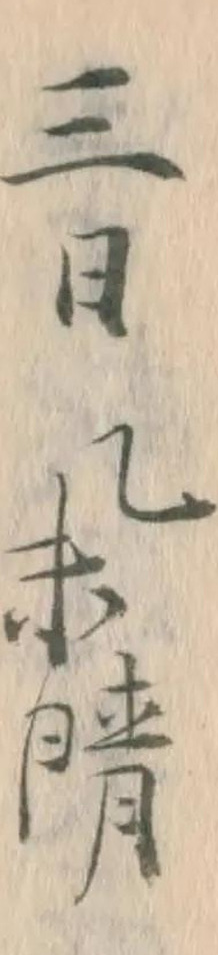三日乙未晴
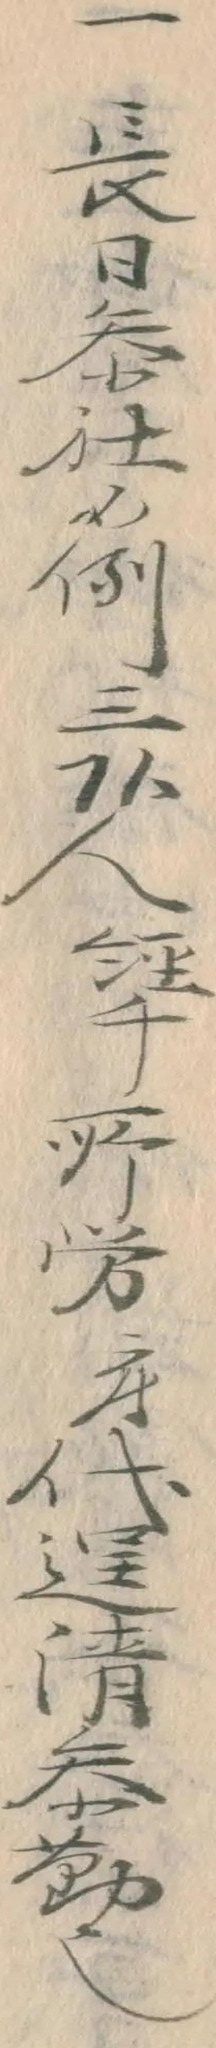一長日参社如例三頭人経千所労ニ付代逞清参勤也
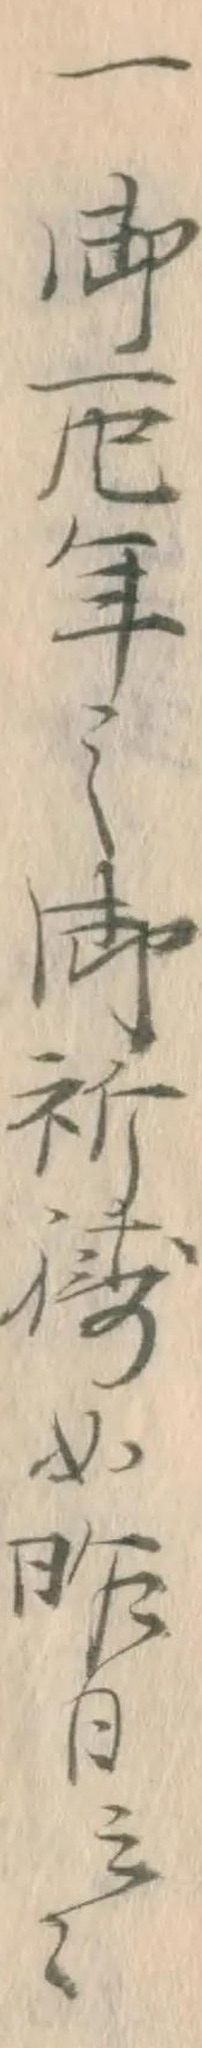一御厄年之御祈祷如昨日云々
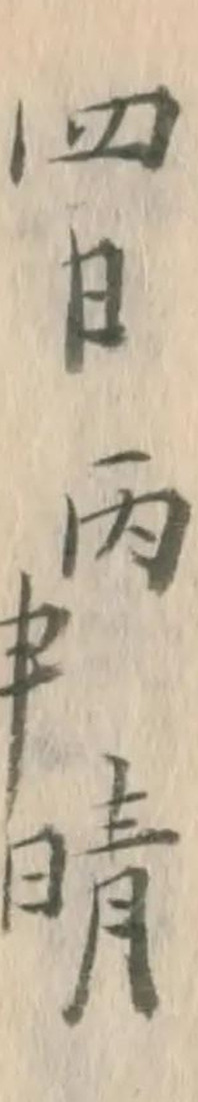四日丙申晴

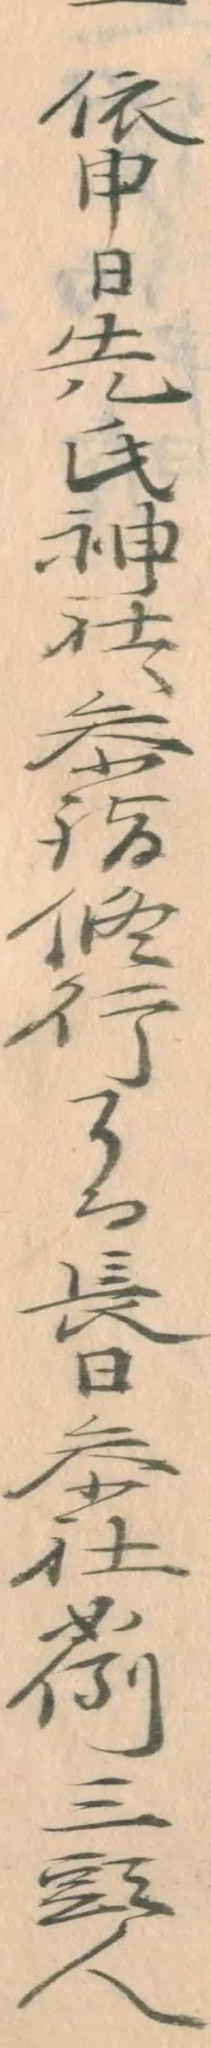一依申日先氏神社へ参詣修行了而長日参社如例三頭人
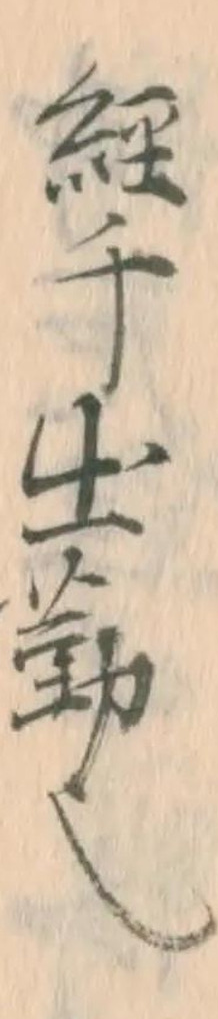経千出勤也
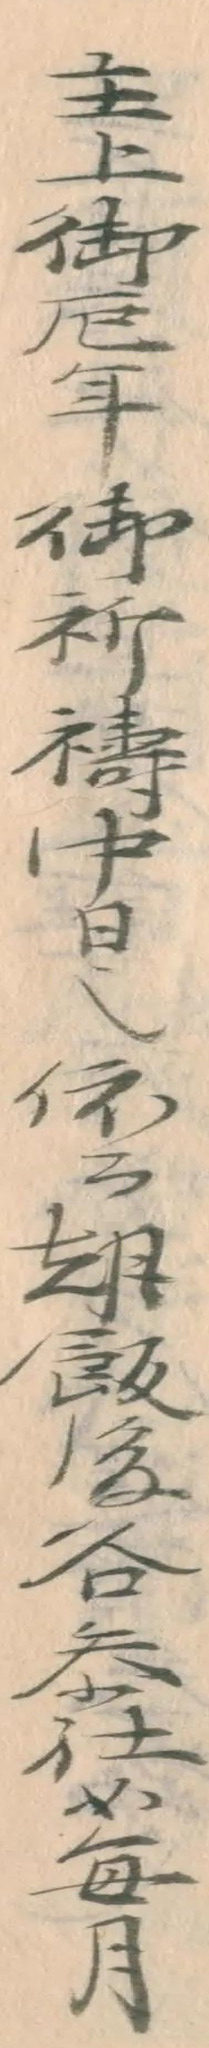一主上御厄年御祈祷中日也依而朝飯後各参社如毎月
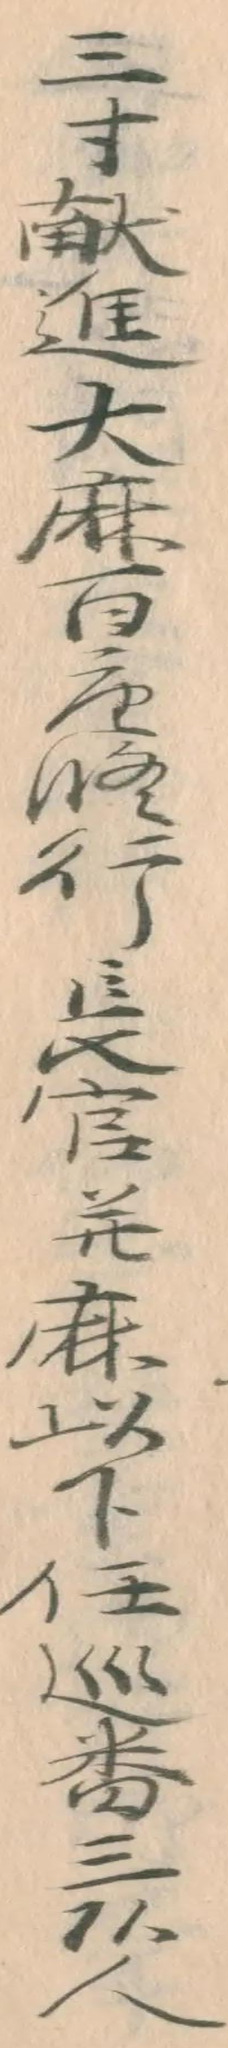三寸献進大麻百座修行長官并麻以下任巡番三頭人
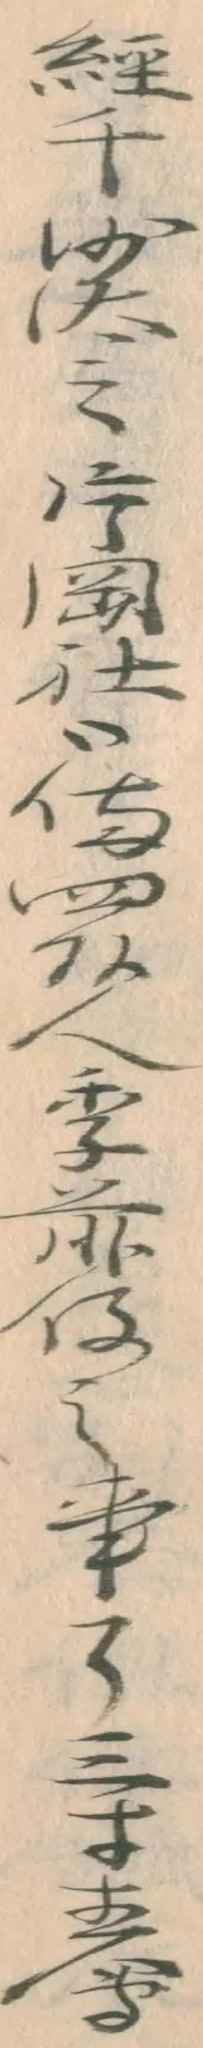経千沙汰之片岡社御備四頭人季前役之事了三寸直會
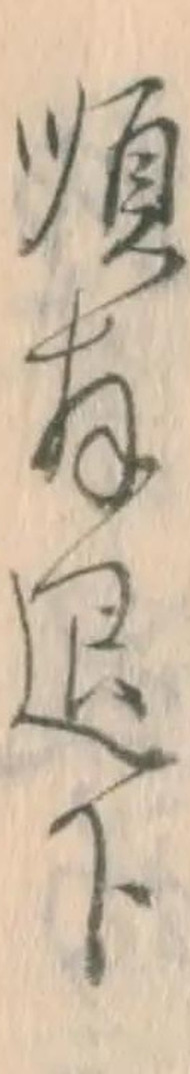順拝退下
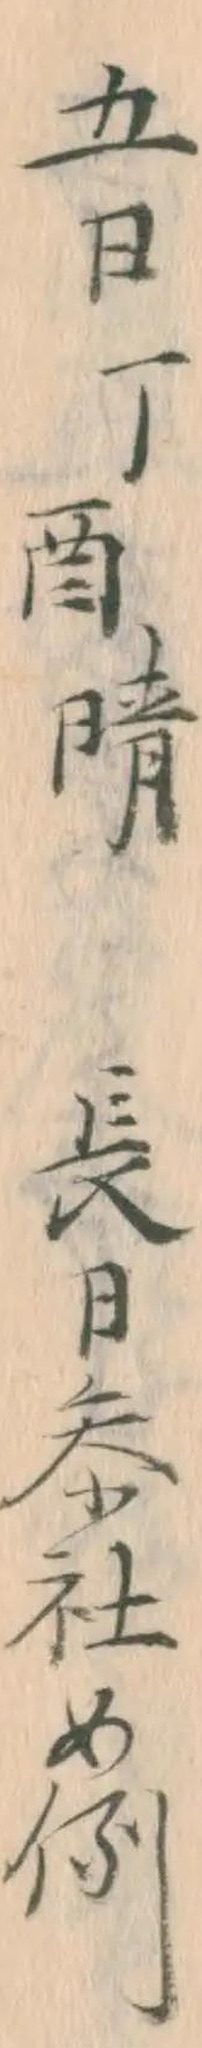五日丁酉晴長日参社如例
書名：賀茂社記録. 第73冊
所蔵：国立国会図書館 National Diet Library, JAPAN
